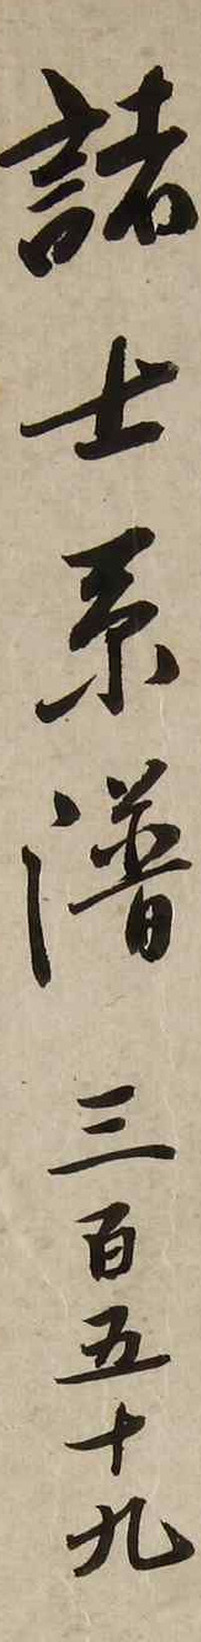諸士系譜三百五十九

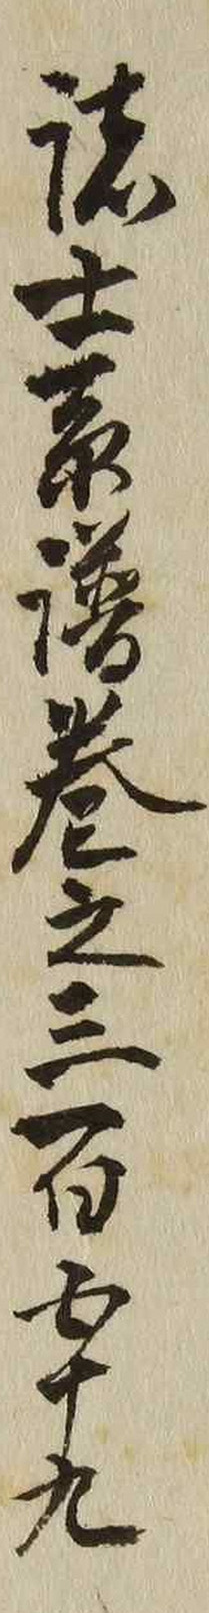諸士系譜巻之三百五十九
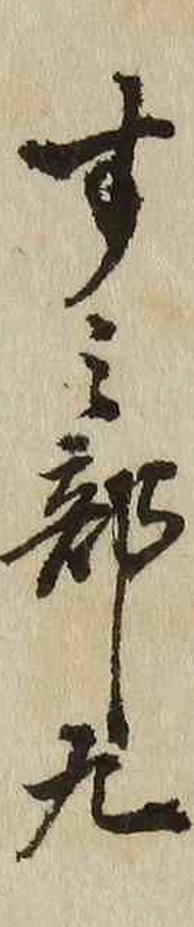す之部九
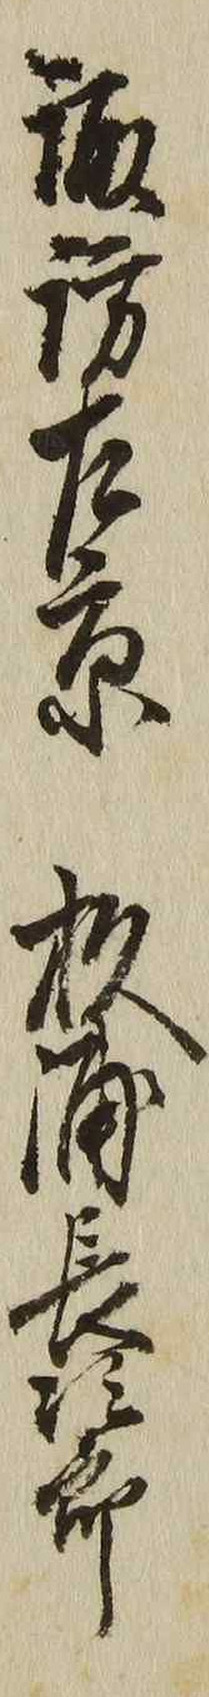諏訪左京杉浦長次郎
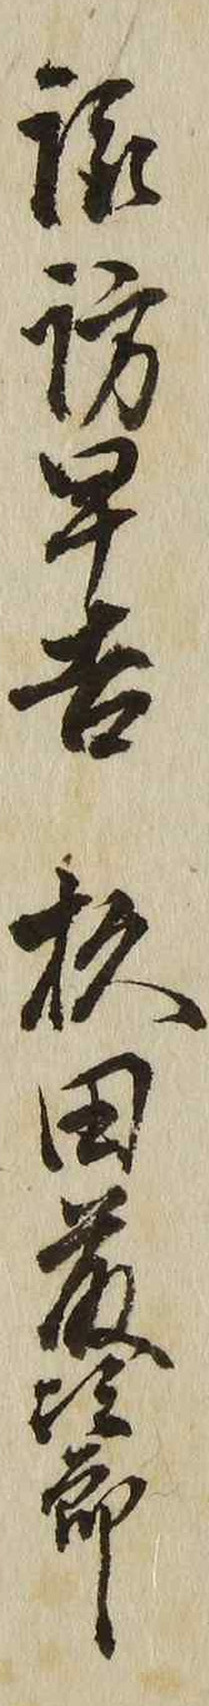諏訪早吉杉田藤次郎
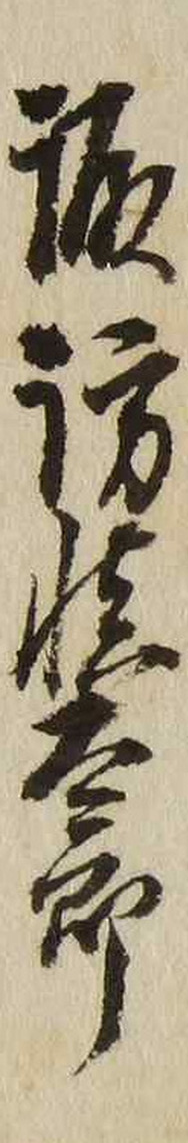諏訪慎太郎

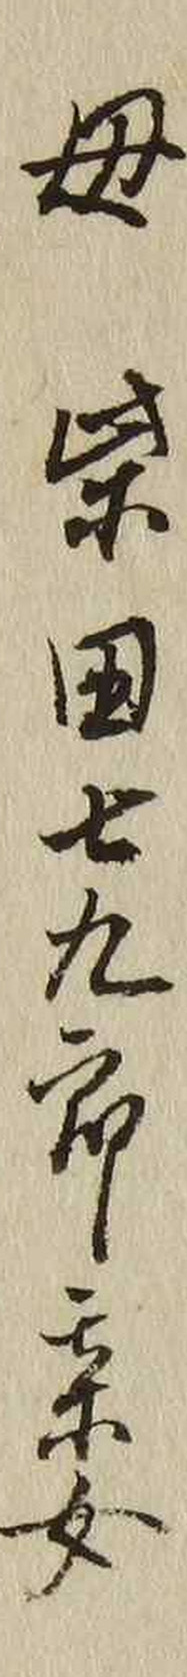母柴田七九郎某女
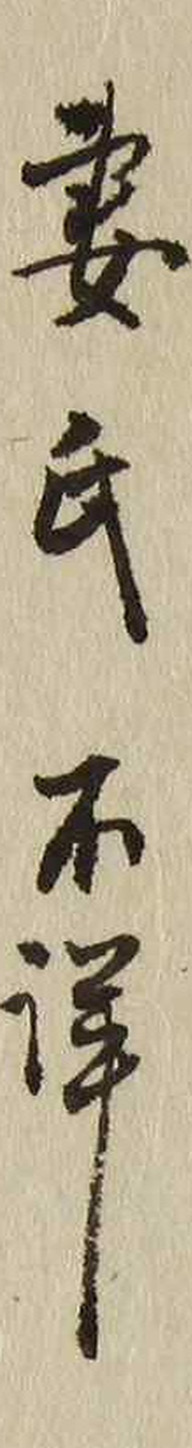妻氏不詳
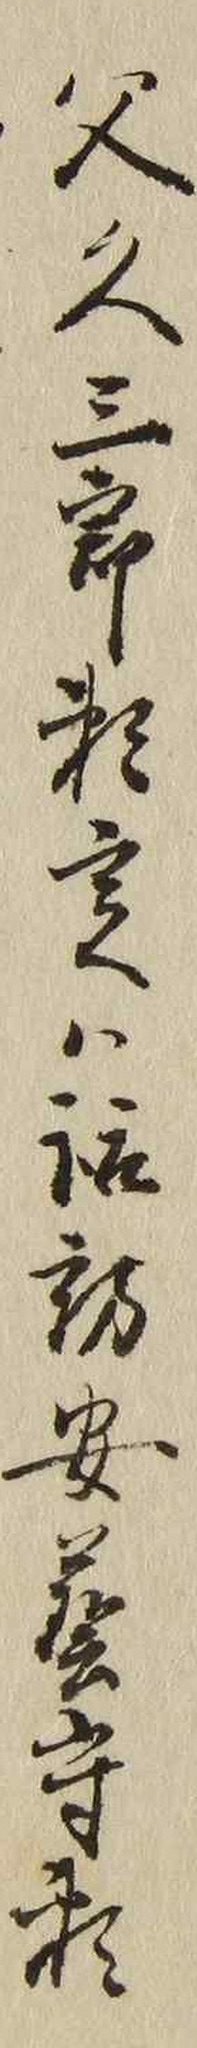父久三郎頼定ハ諏訪安芸守頼
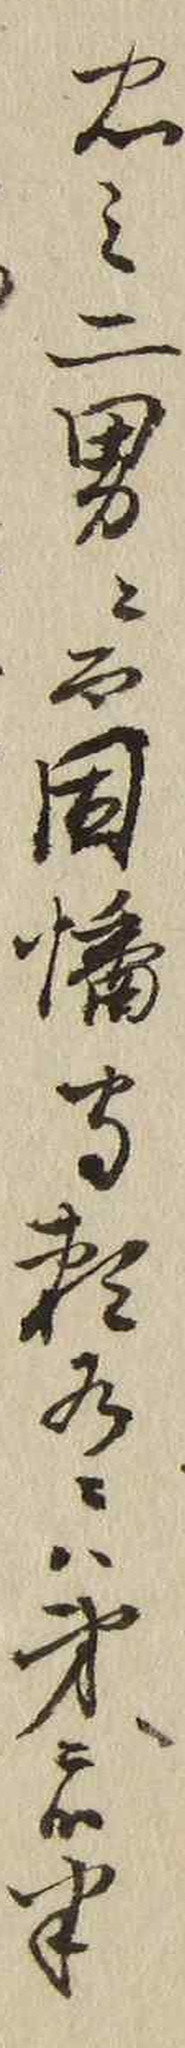忠之二男ニ而因幡守頼水ニハ弟ニ候半
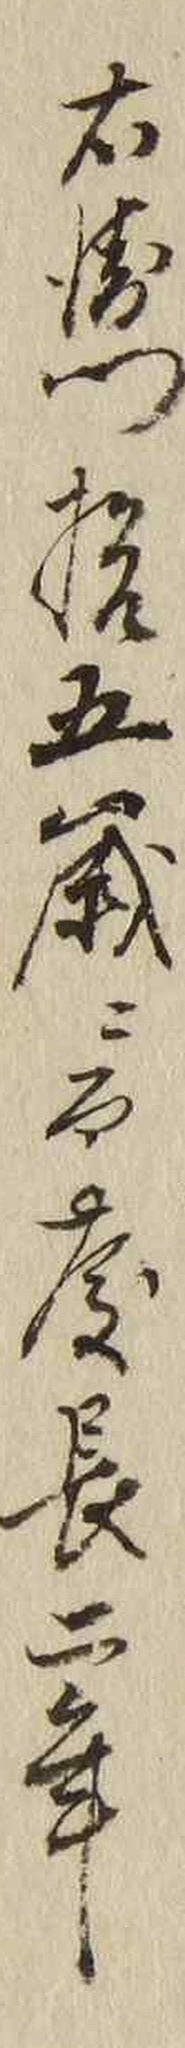右衛門拾五歳ニ而慶長二年

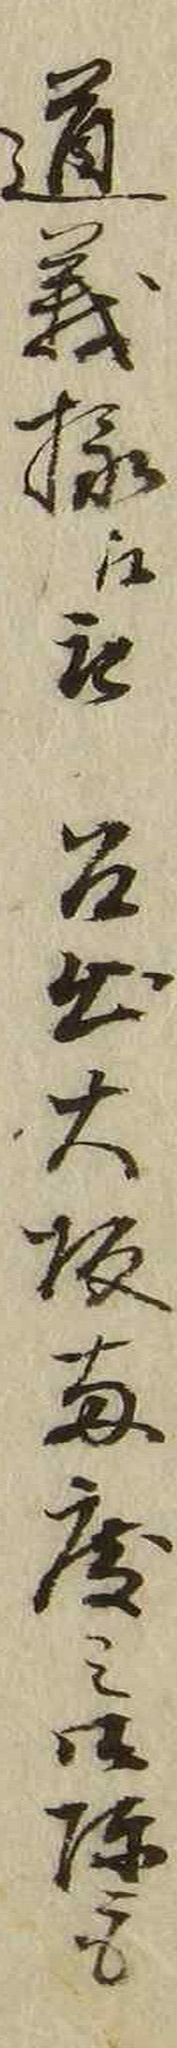道義様江被召出大坂両度之御陣ニも
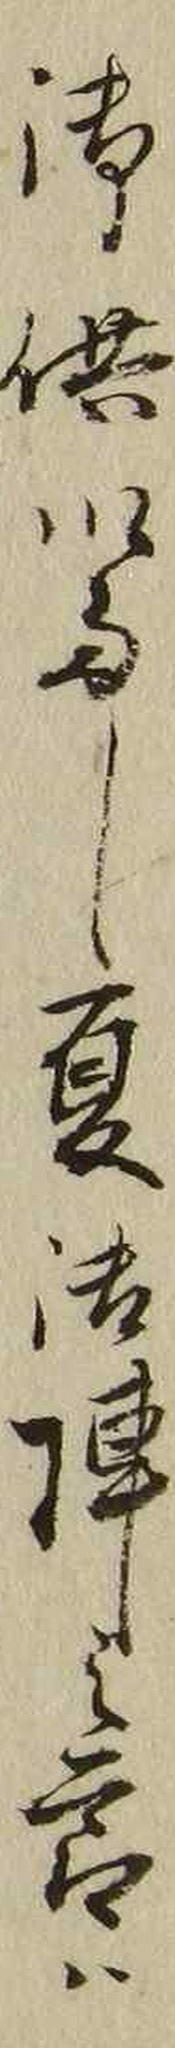御供いたし夏御陣之節ハ
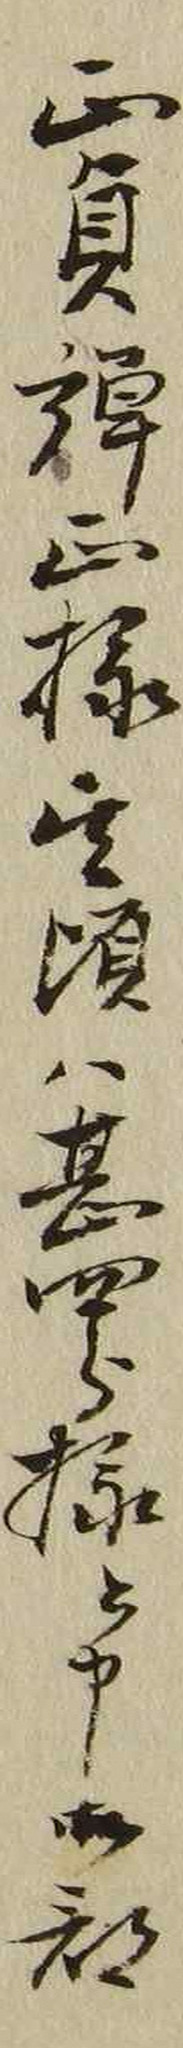正貞弾正様其頃ハ甚四郎様と申御部
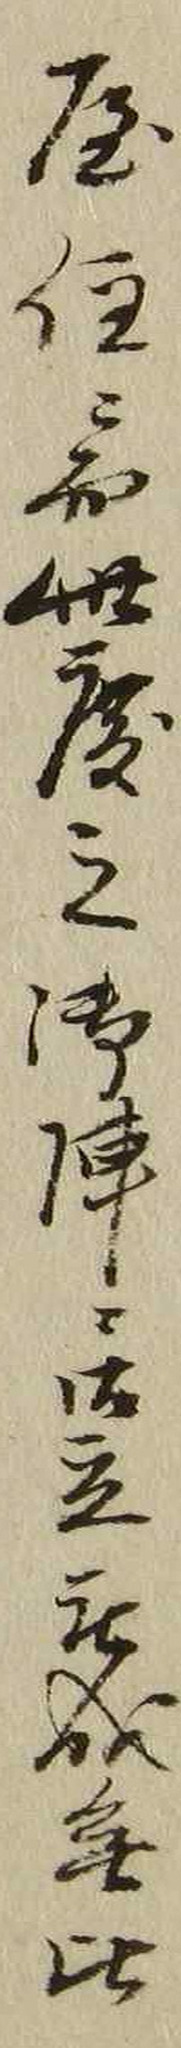屋住ニ而此度之御陣ニ御立被成無比
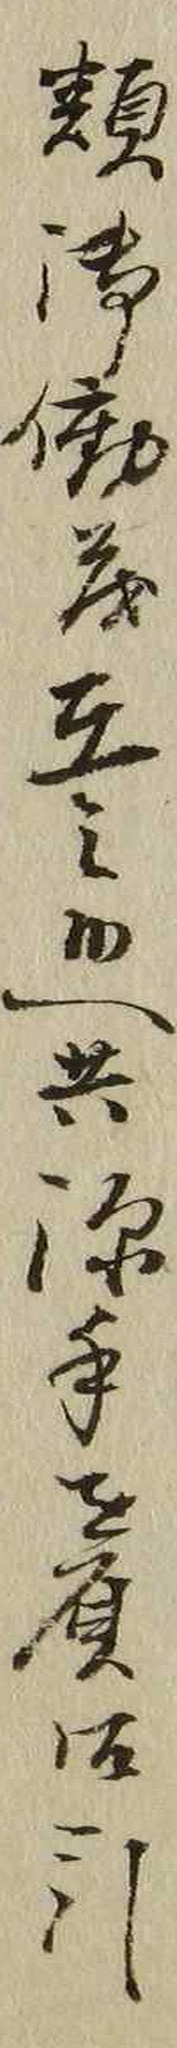類御働茂在之候へ共深手を負御引
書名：諸士系譜　巻之359　す之部9
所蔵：会津若松市立会津図書館
